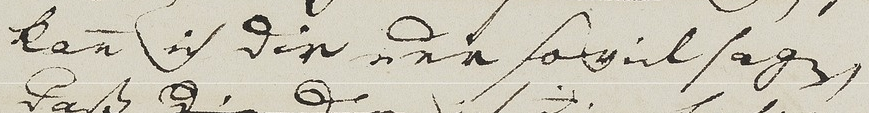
kann ich Dir nur so viel sagen,
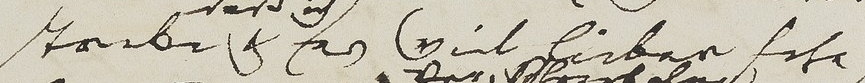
strebe & daß ich es viel lieber sehe,
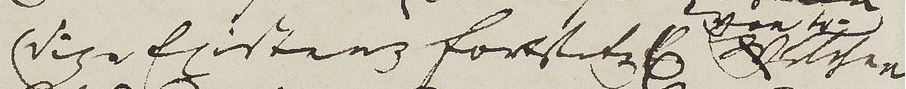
dige Existenz fortsetzten. WVon welchen
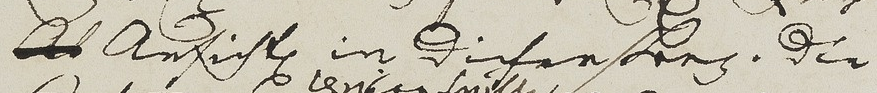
Ab Ansichten in dieser Bez. die
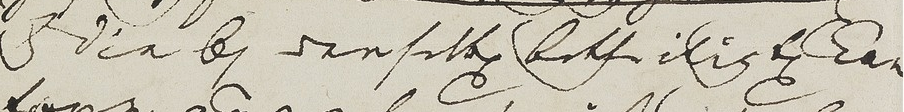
& die bei denselben betheiligten Can-
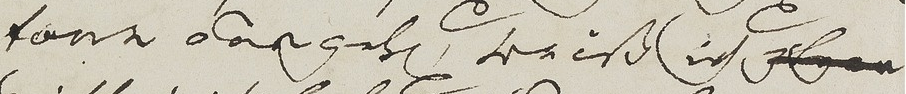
tone ausgehen, weiß ich zwar
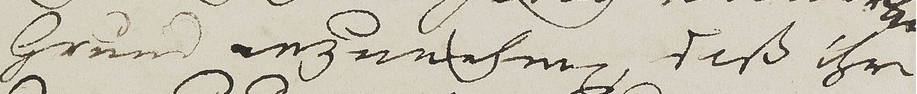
Grund anzunehmen, daß ihre
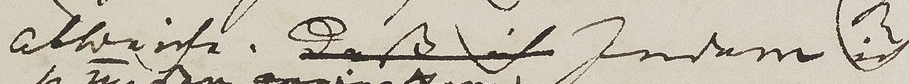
abweiche. Daß ich Indem ich
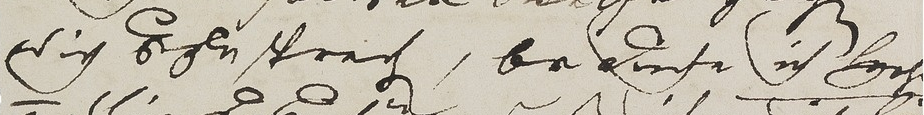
Dich auszusprechen, brauche ich wohl
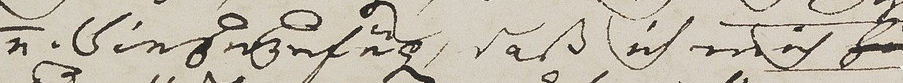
n. hinzuzufügen, daß ich mich hier-
